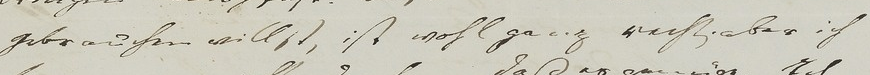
gebrauchen willst, ist wohl ganz recht; aber ich
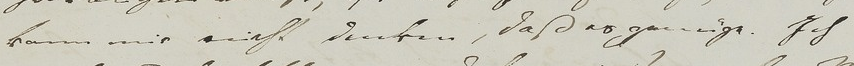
kann mir nicht denken, daß es genüge. Ich
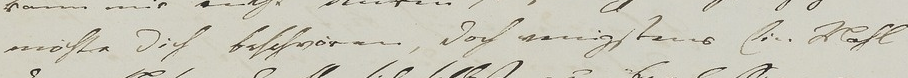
möchte Dich beschwören, doch wenigstens Ein Mahl
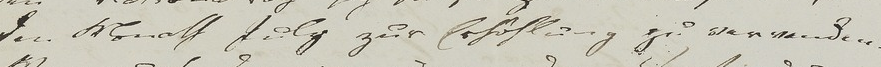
den Monath July zur Erhohlung zu verwenden.
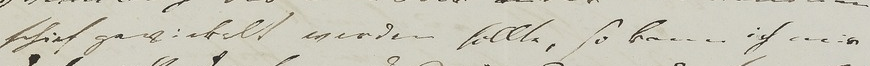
schief gewickelt werden sollte, so kann ich mir
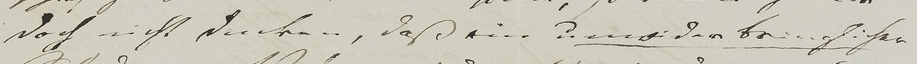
doch nicht denken, daß ein unwiderbringlicher
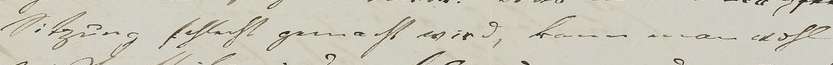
Sitzung schlecht gemacht wird, kann man wohl
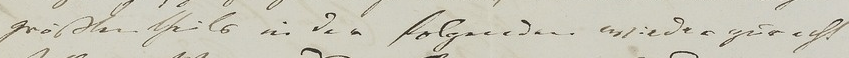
größtentheils in der folgenden wieder zurecht
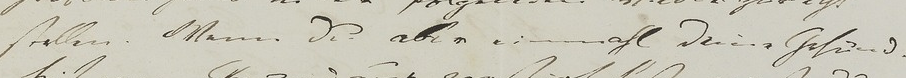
stellen. Wenn Du aber einmahl Deine Gesund-
